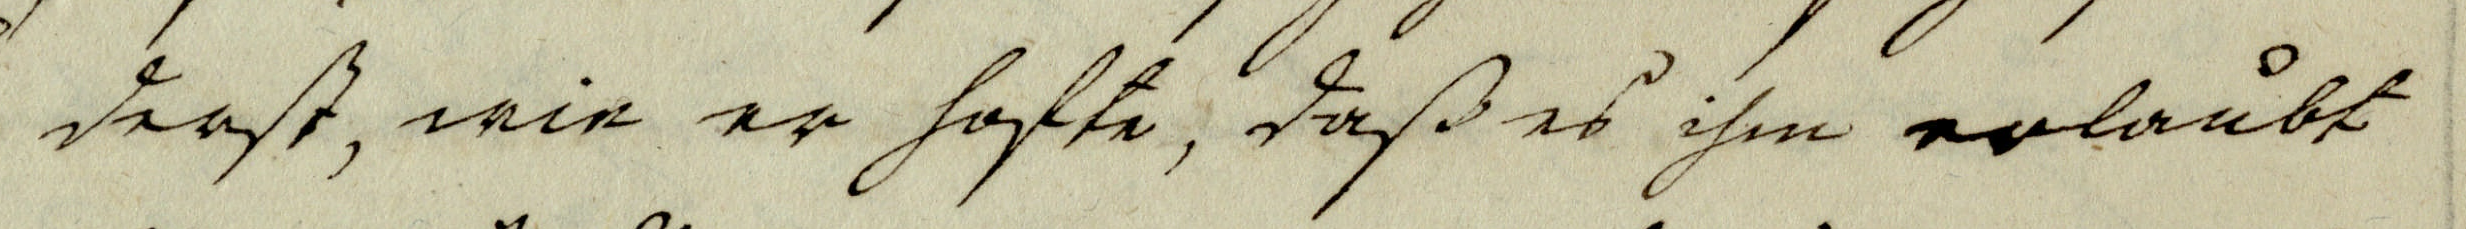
derst, wie er hofte, daß es ihm erlaubt
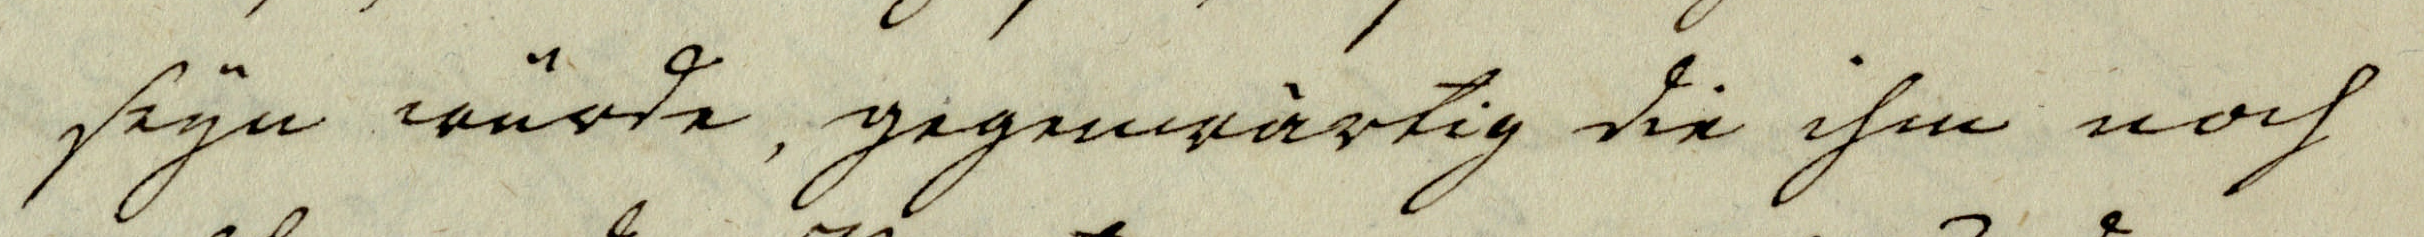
seÿn würde, gegenwärtig die ihm noch
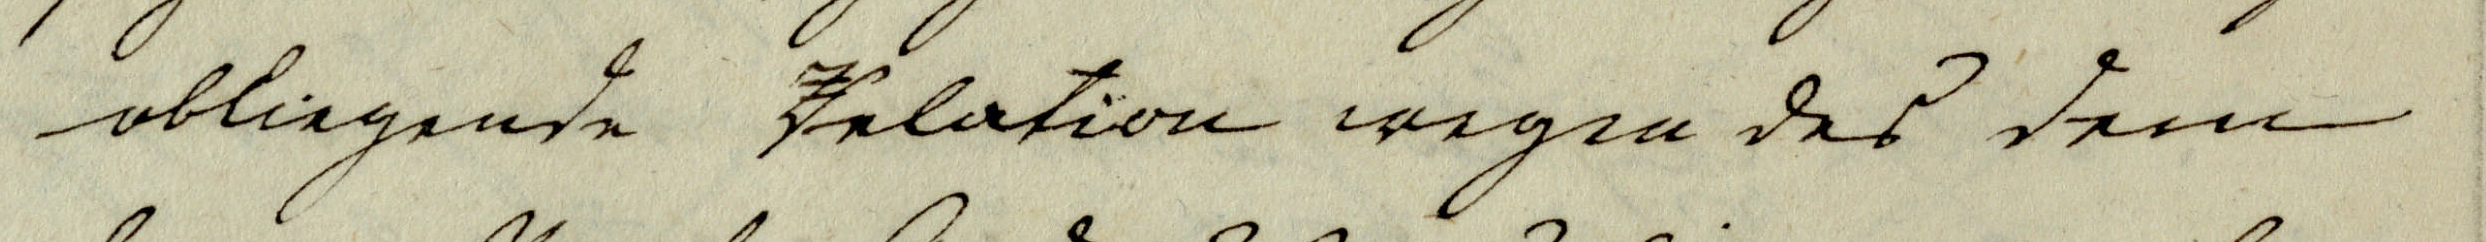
obliegende Relation wegen des dem
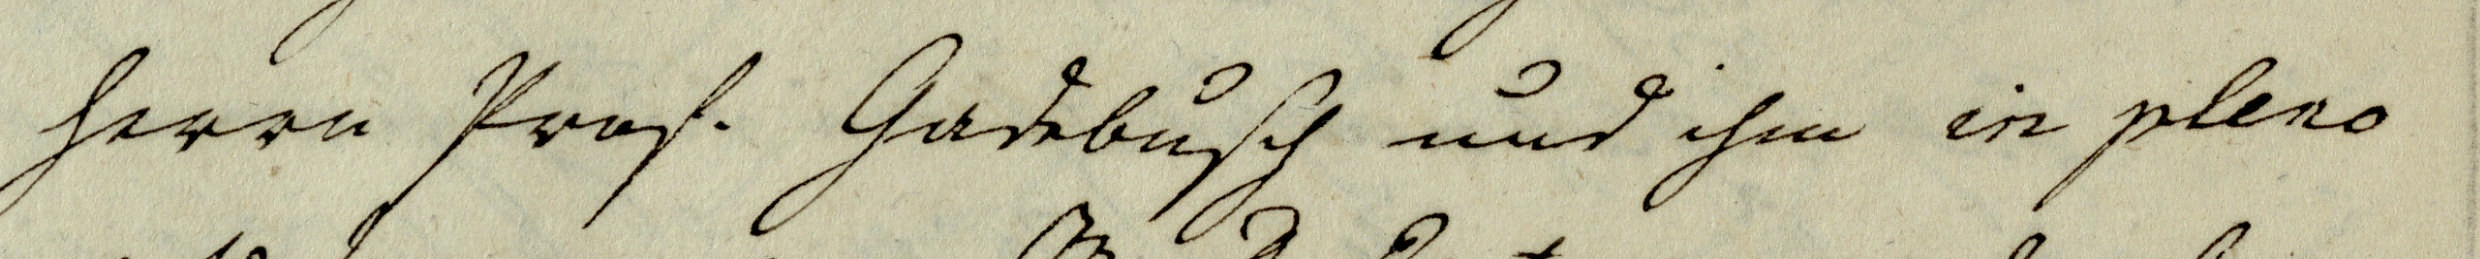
Herrn Prof. Gadebusch und ihm in pleno
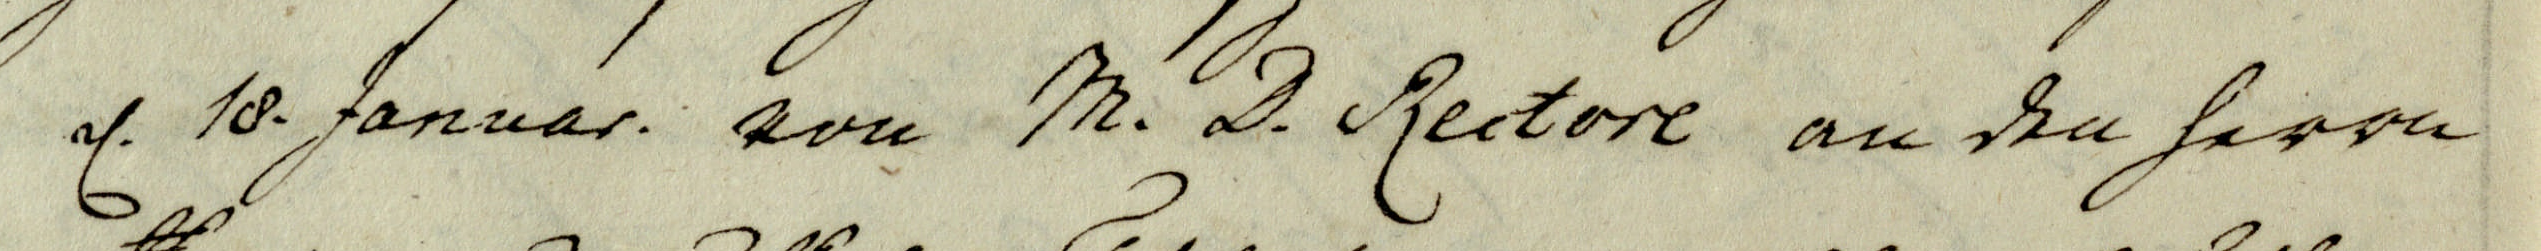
d. 18. Januar. von M. D. Rectore an den Herrn
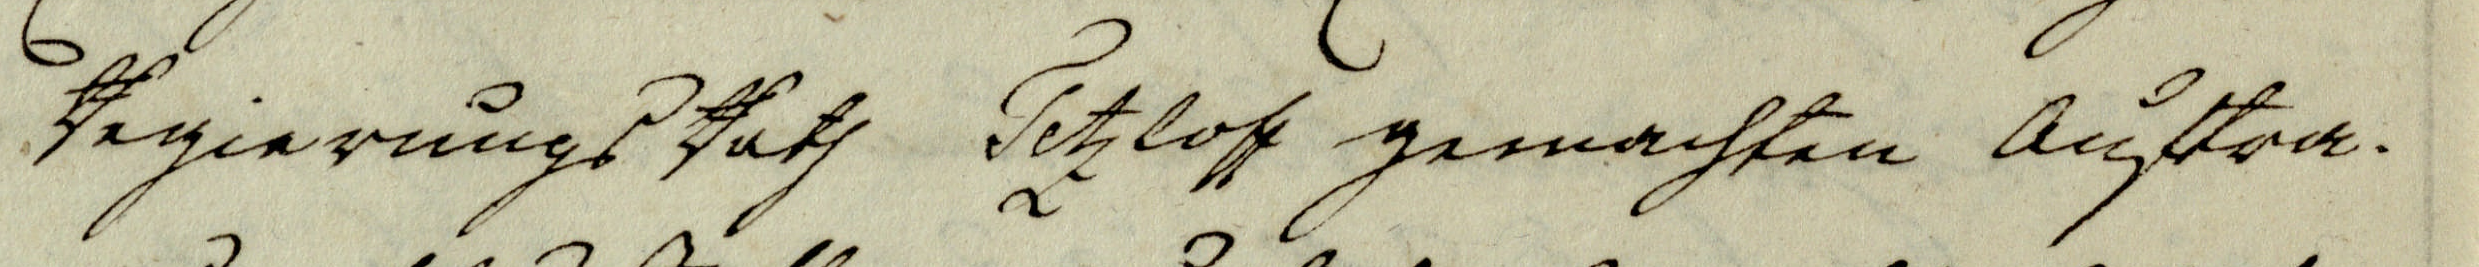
Regierungs Rath Tetzloff gemachten Auftra¬
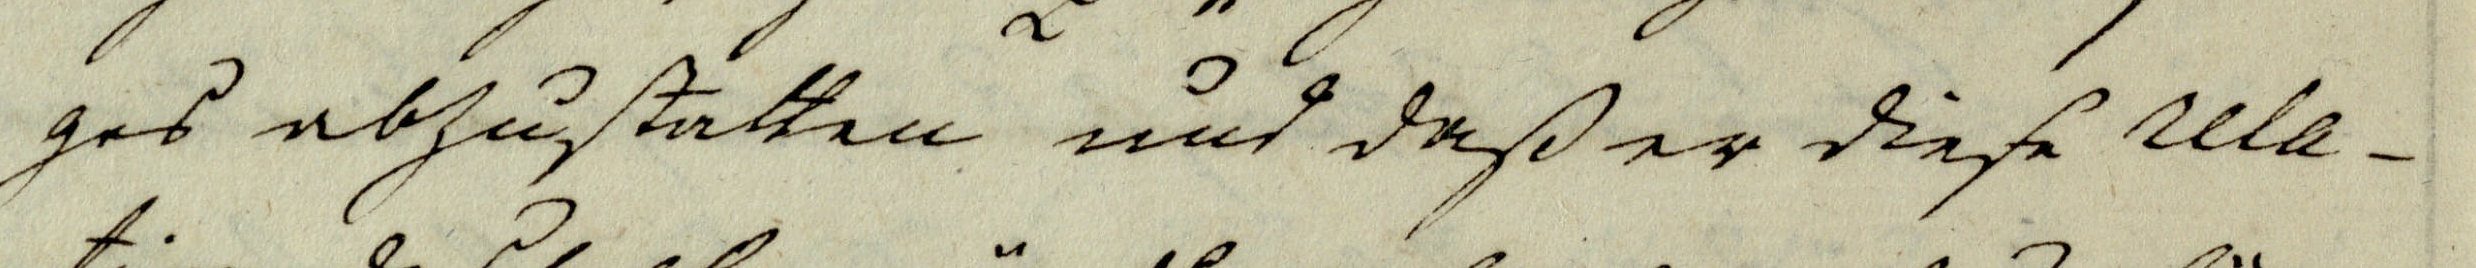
ges abzustatten und daß er diese rela¬
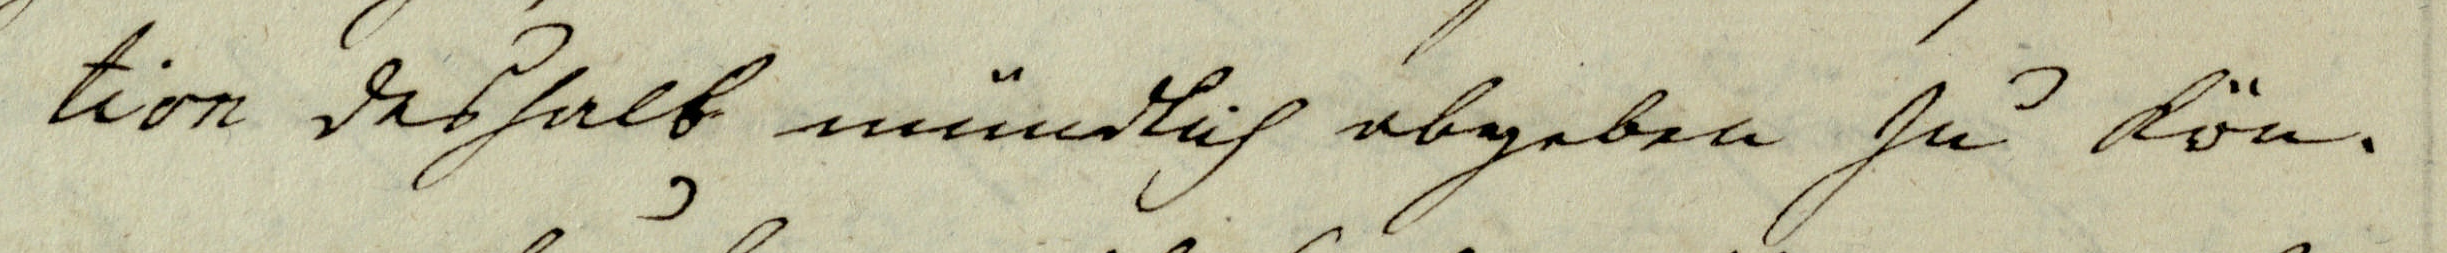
tion deshalb mündlich abgeben zu kön¬
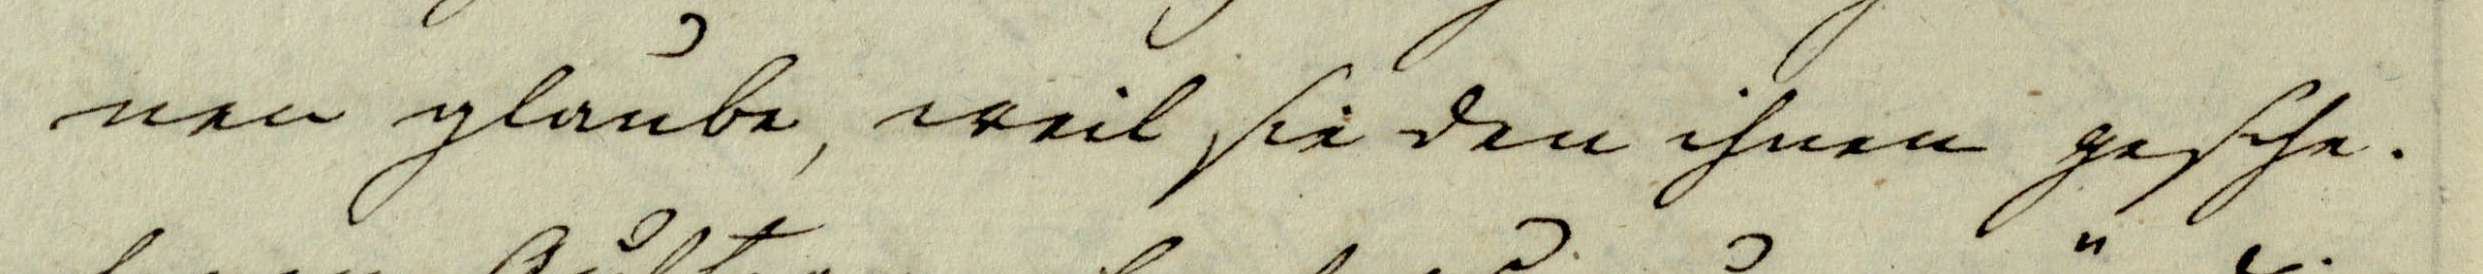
nen glaube, weil sie den ihnen gesche¬
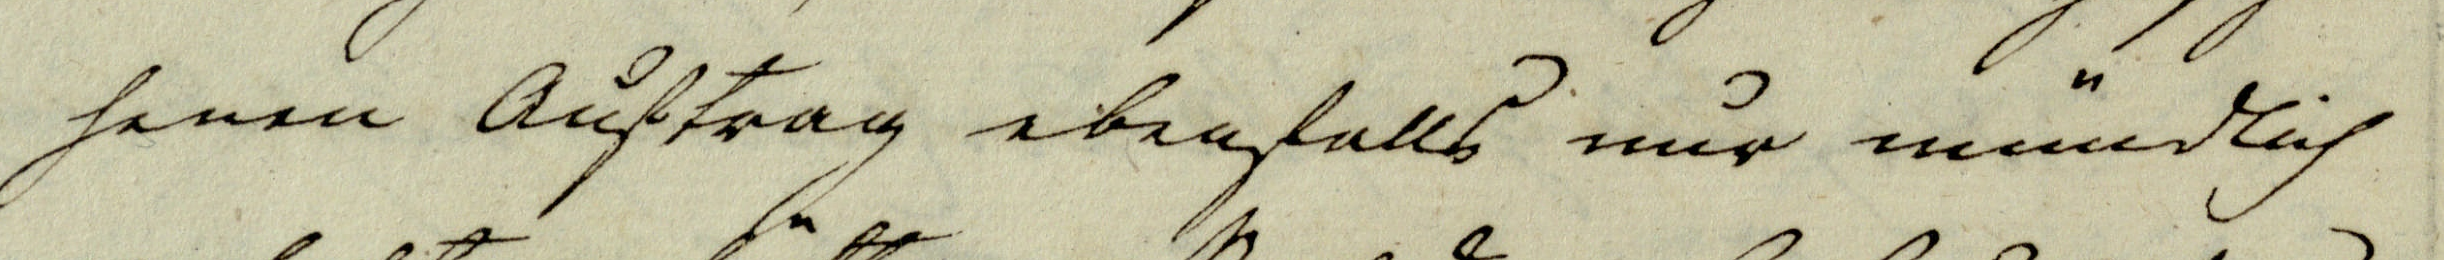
henen Auftrag ebenfalls nur mündlich
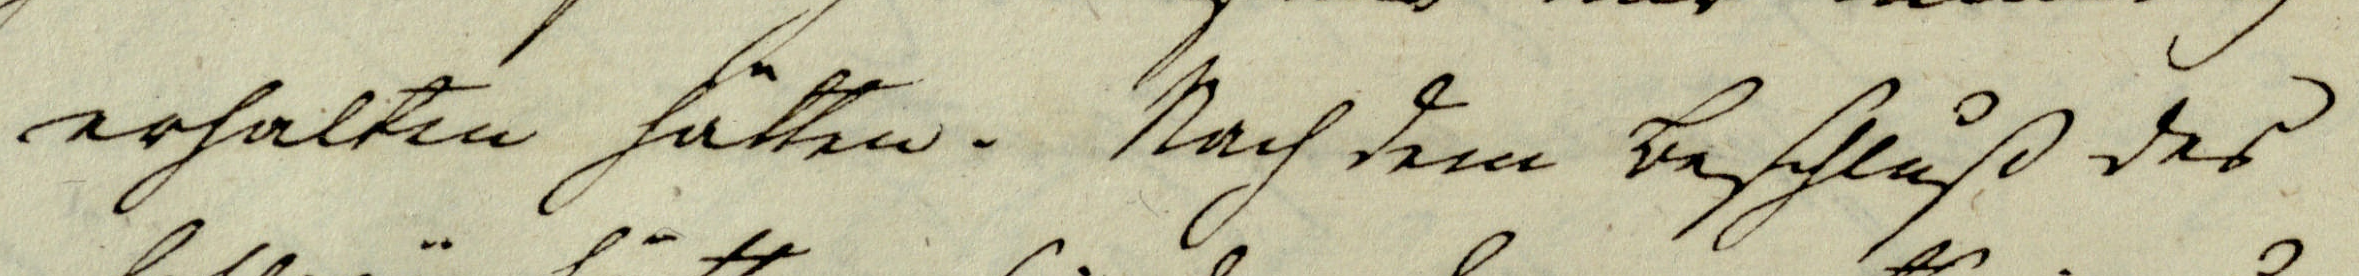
erhalten hätten. Nach dem Beschluß des
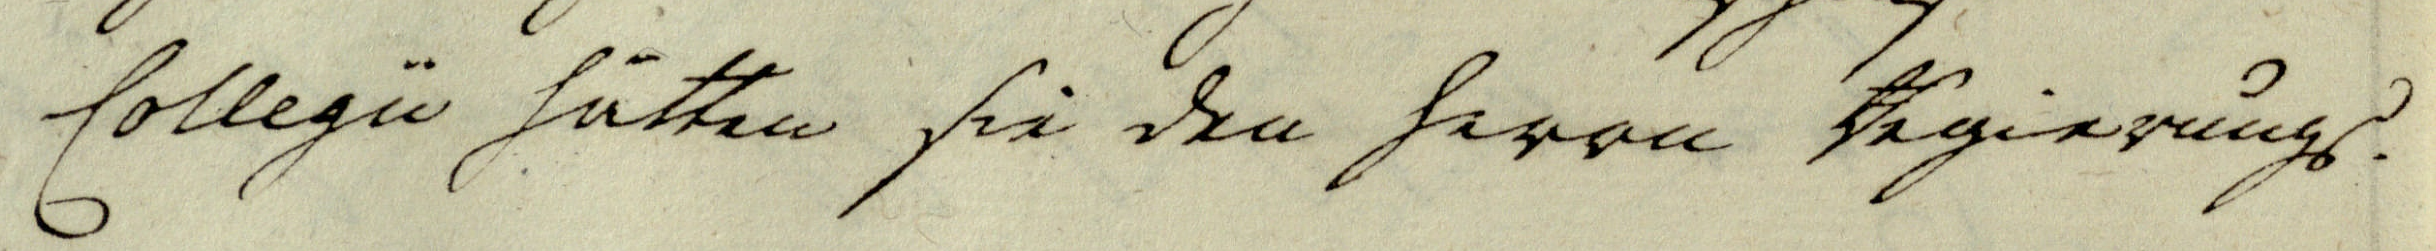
Collegii hätten sie den Herrn Regierungs¬
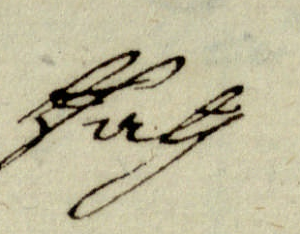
Rath
